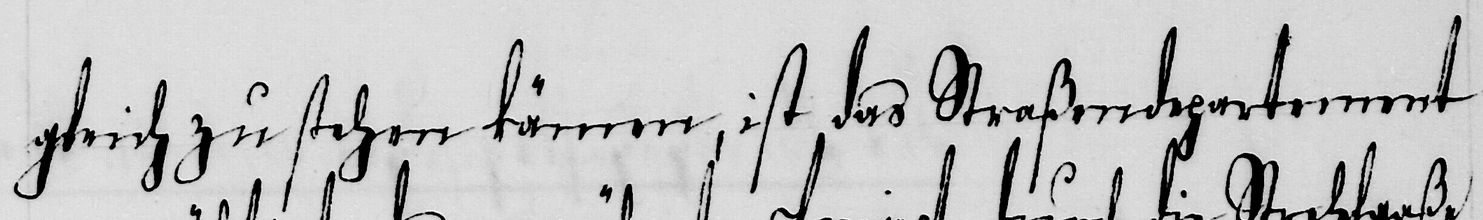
gleich zu stehen kämen, ist das Straßendepartement
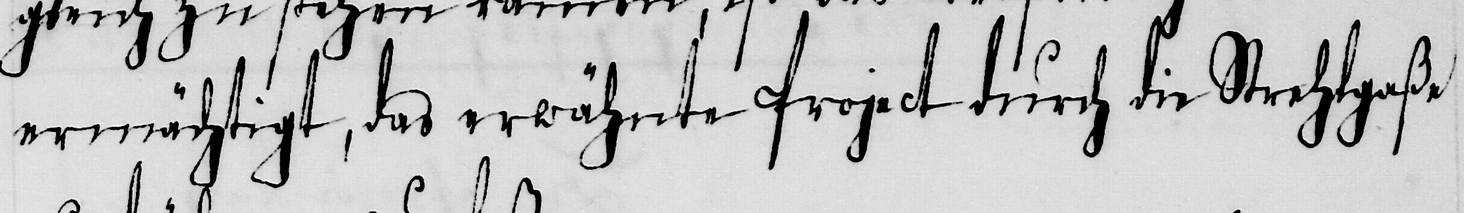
ermächtigt, das erwähnte Project durch die Strehlgaße
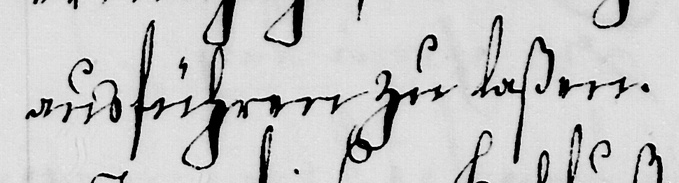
ausführen zu laßen.
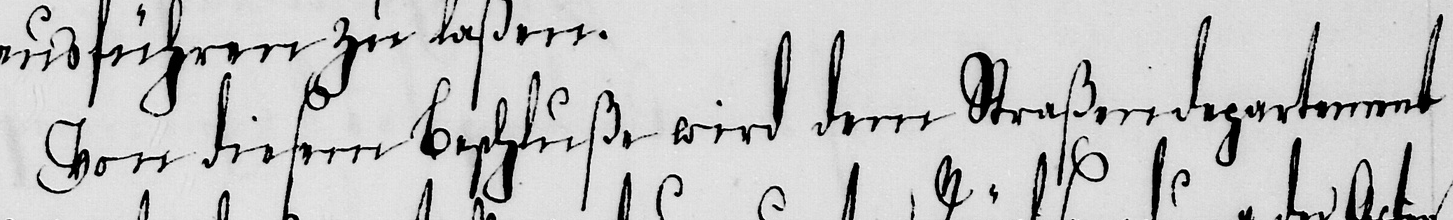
Von diesem Beschluße wird dem Straßendepartement
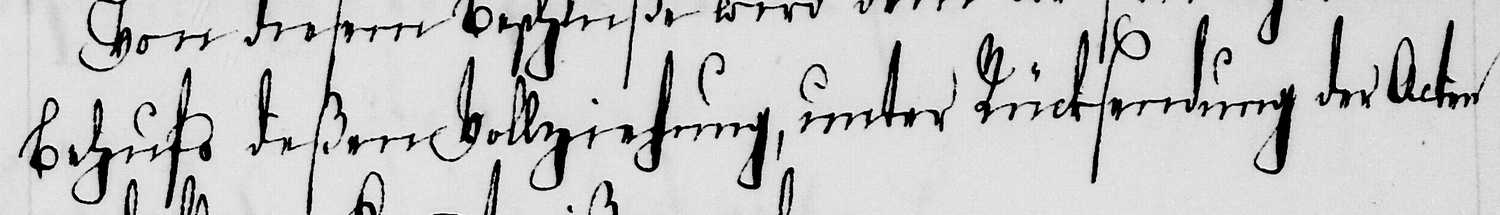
Behufs deßen Vollziehung, unter Rücksendung der Acten
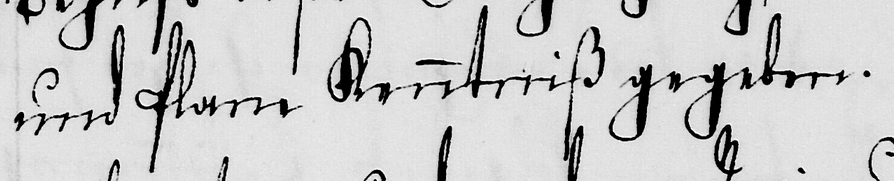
und Plane Kenntniß gegeben.
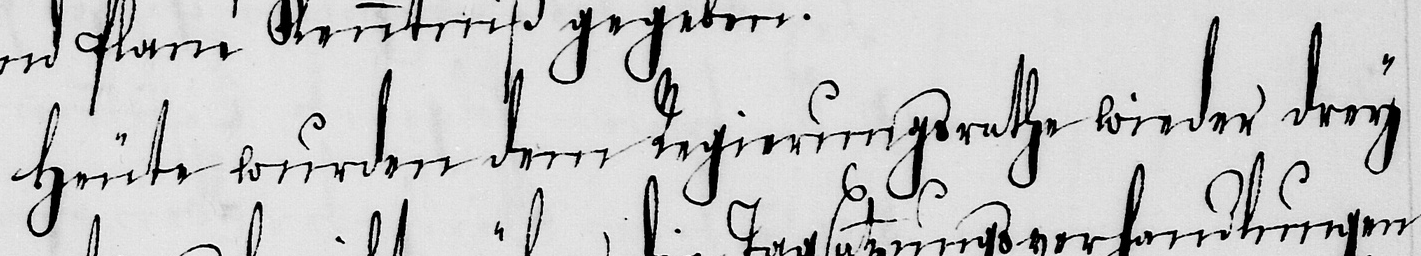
Heute wurden dem Regierungsrathe wieder drey
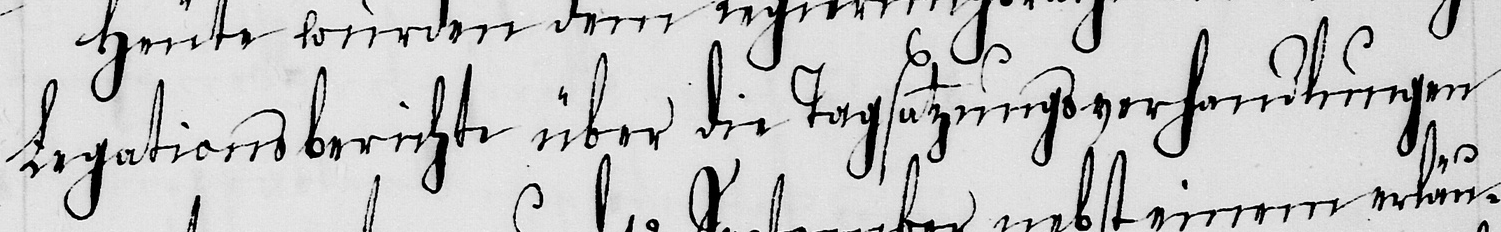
Legationsberichte über die Tagsatzungsverhandlungen
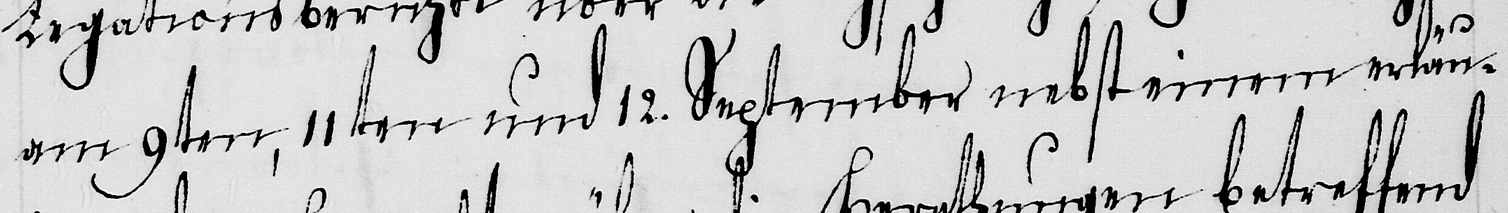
am 9ten, 11ten und 12. September nebst einem erläu¬
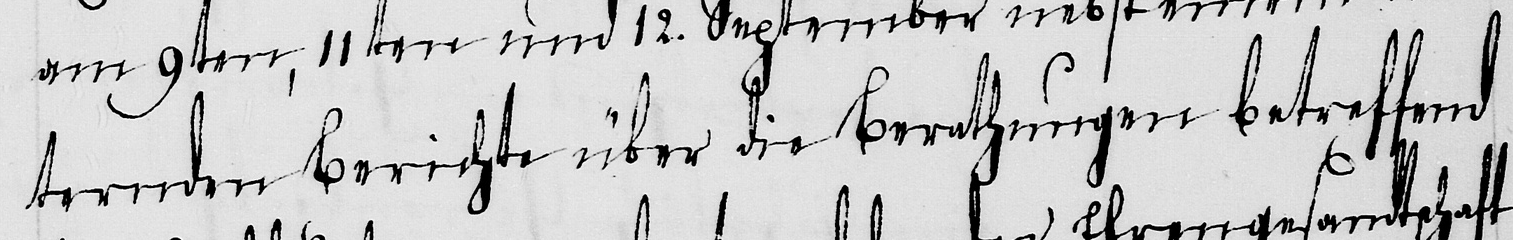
ternden Berichte über die Berathungen betreffend
